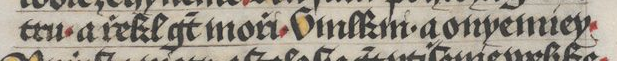tru.a ṙekl ḡt moṙi.Vmlkni.a onyemiey
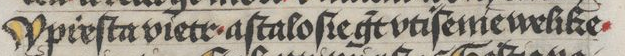Y pṙeſta vietr.a ſtalo ſie ḡt vtiẛenie welike.
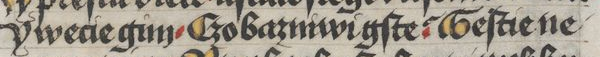Y wecie gim.Czo bazniwi gſte Geẛtie ne¬
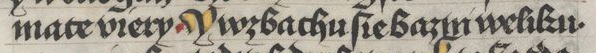mate viery. A wzbachu ſie bazni weliku.
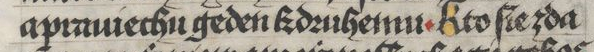a przaíechu geden k druhemu.Kto ſie zda¬
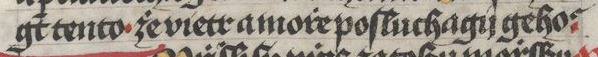ḡt tento.że víetr a moṙe poſluchagij geho?
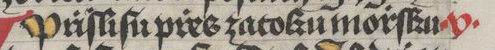Pṙiẛli ſu pṙes zatoku moṙſku.v.
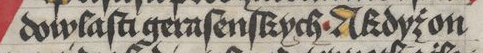do wlaſti garaſenſkých.A kdyż on
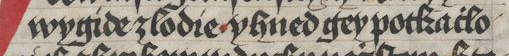wygíde z lodie.yhned gey potka ċlo¬
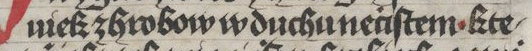uiek z hrobow w duchu neċiſtem.kte¬
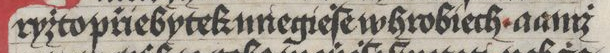ryżto pṙíebýtek miegíeẛe w hrobiech.a aniż
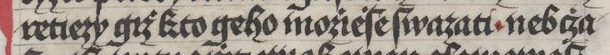retiezy giż kto geho možíeẛe ſwazati.neb cża¬
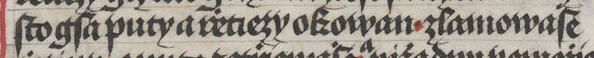ſto gſa puty a ṙetiezy okowan zlamowaẛe
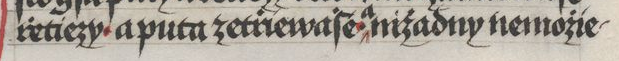ṙetiezy.a puta zetṙíewaẛe. a niżadny nemożíe
